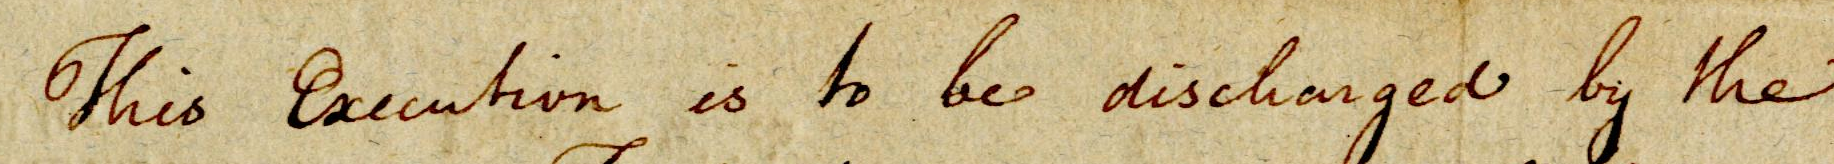This Execution is to be discharged by the
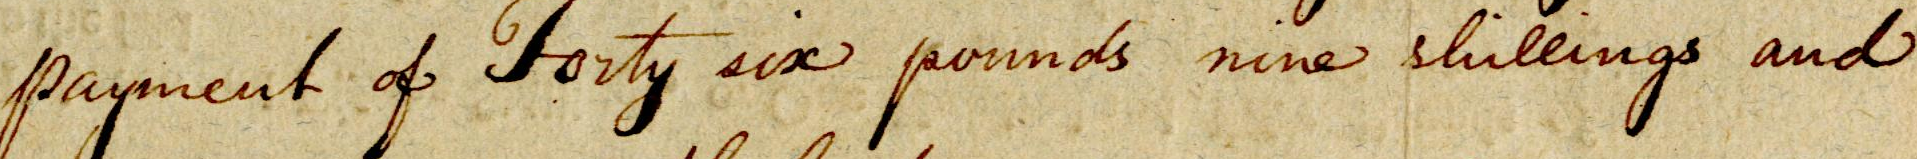Payment of Forty Six pounds nine shillings and
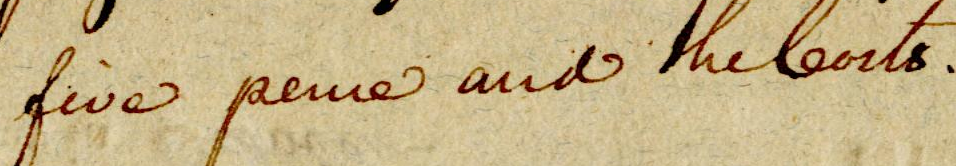five pence and the costs
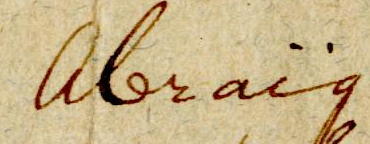Albraig
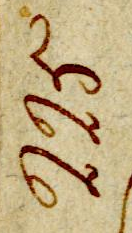225
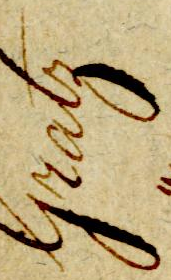Gratz
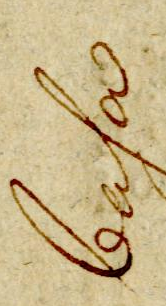Casa
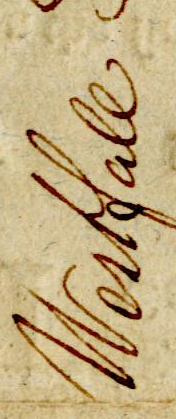Westfall
